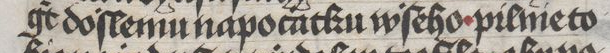ḡt doẛlému napoċatku wẛeho.pilnie to¬
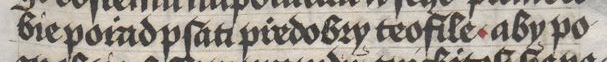bie poṙad pſati pṙedobry teofile.aby po¬
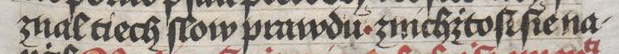znal tiech ſlow prawdu.znichżtoſi ſie na¬
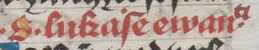S.lukaẛe ewam.ti.
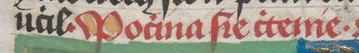uċil.Poċina ſie ċtenie¬
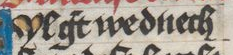Yl ḡt we dnech
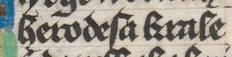herodeſa krale
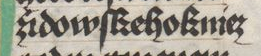zidowſkehokniez
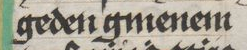geden gmenem
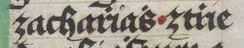zachariaṡ.ztṙie¬
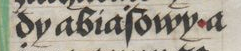dy abiaẛowy.a
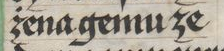żena gemu że¬
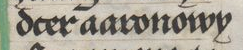dcer aaronowy¬
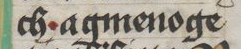ch.a gmeno ge
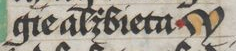gíe alżbeeta Y
